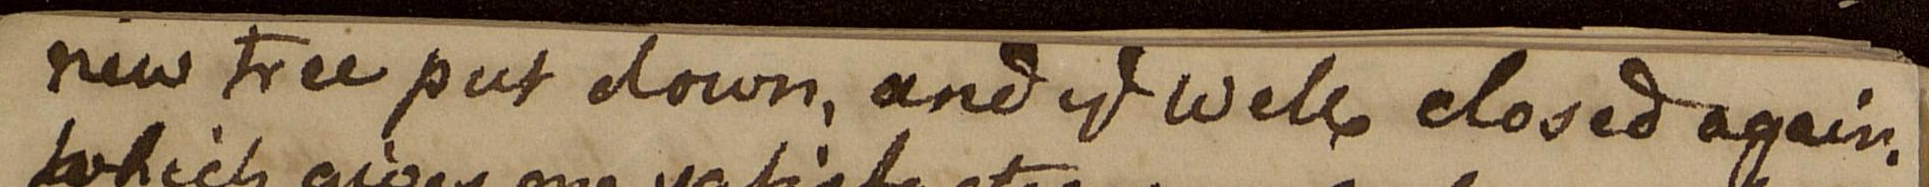new tree put down, and y^e Well closed again.
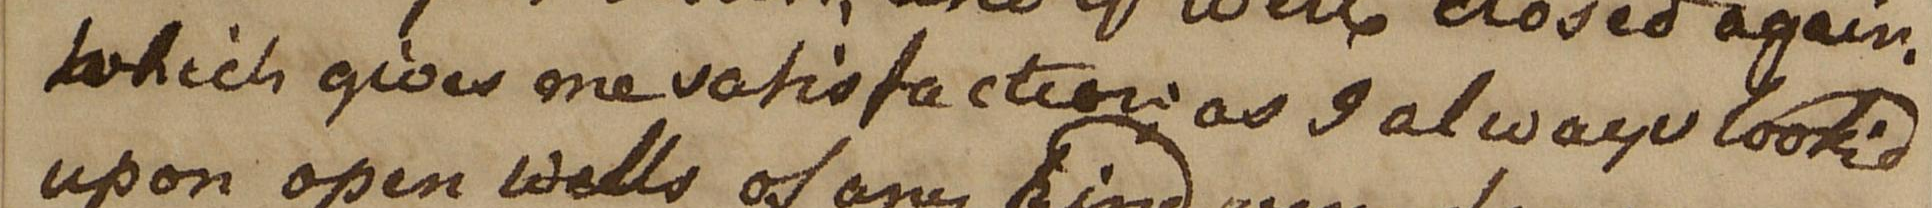which gives me satisfaction as I always look'd
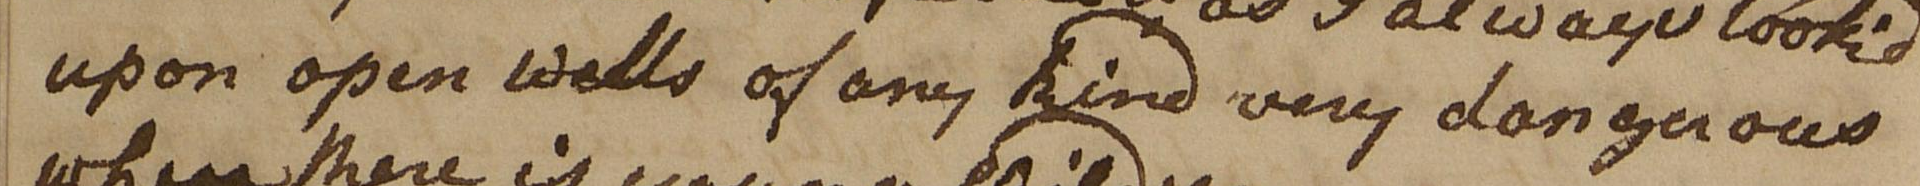upon open wells of any kind very dangerous
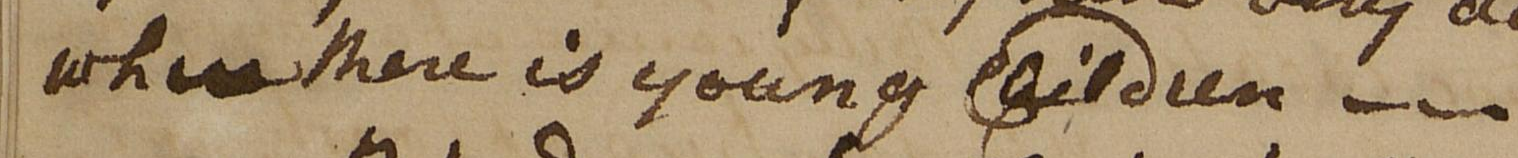where there is young Children-
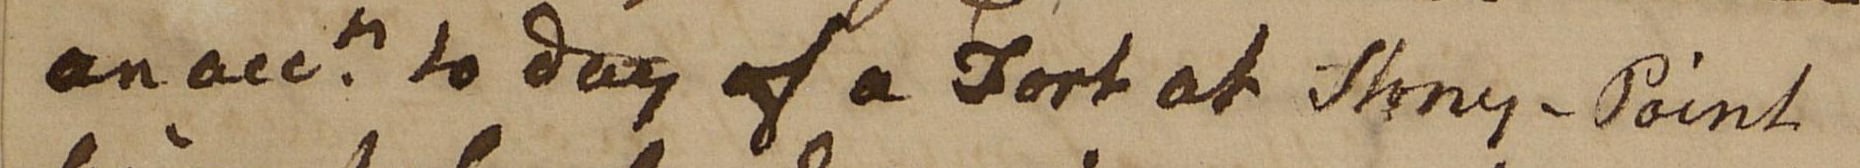an acc^t. to day of a Fort at Stony- Point
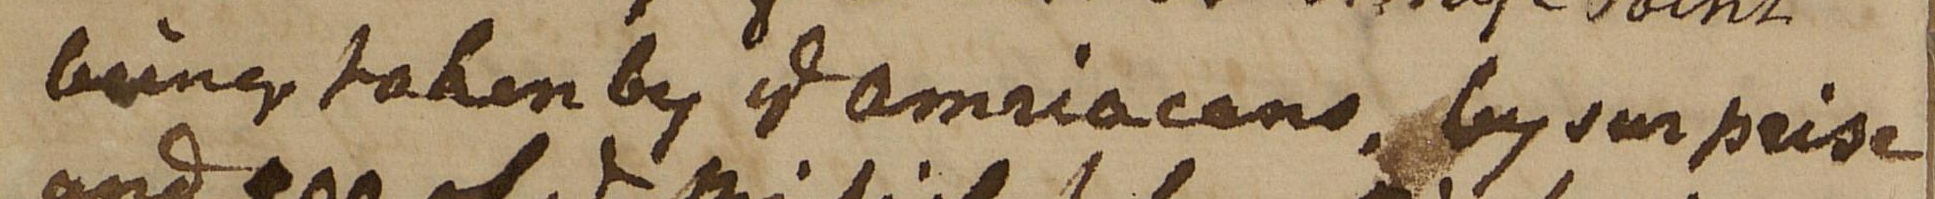being taken by y^e Amriacans, by surprise
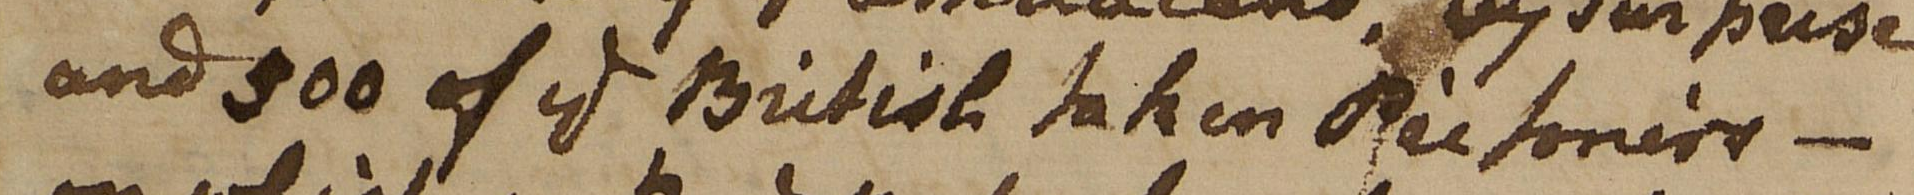and 500 of y^e British taken Prisoners-
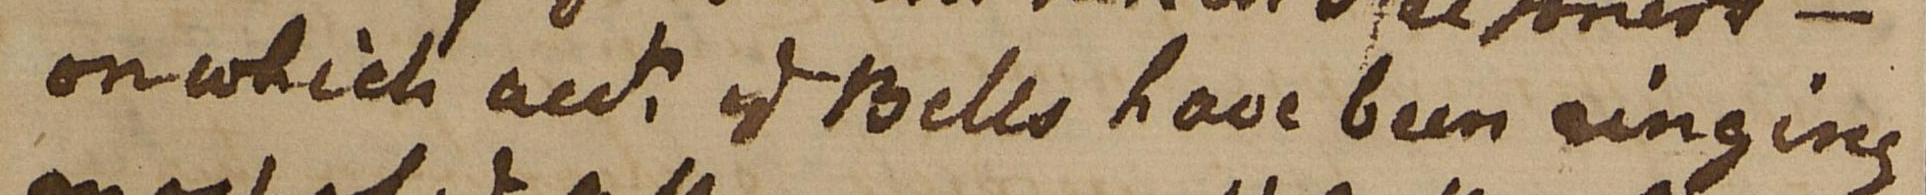on which acc^t. y^e Bells have been ringing
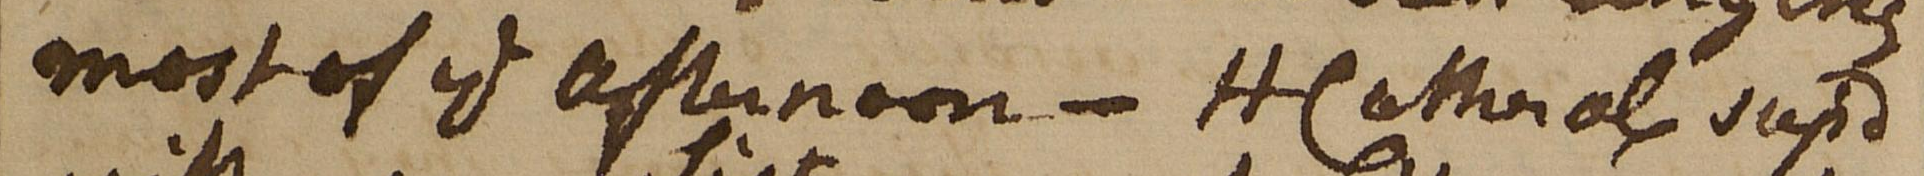most of y^e afternoon- H Catheral sup'd
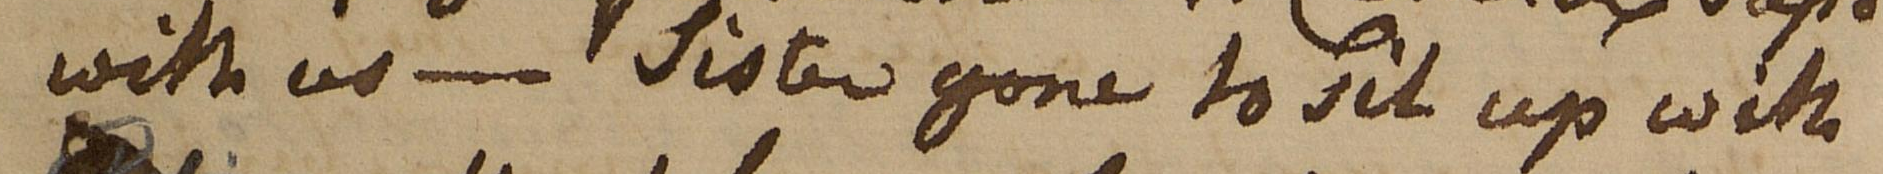with us- Sister gone to sit up with
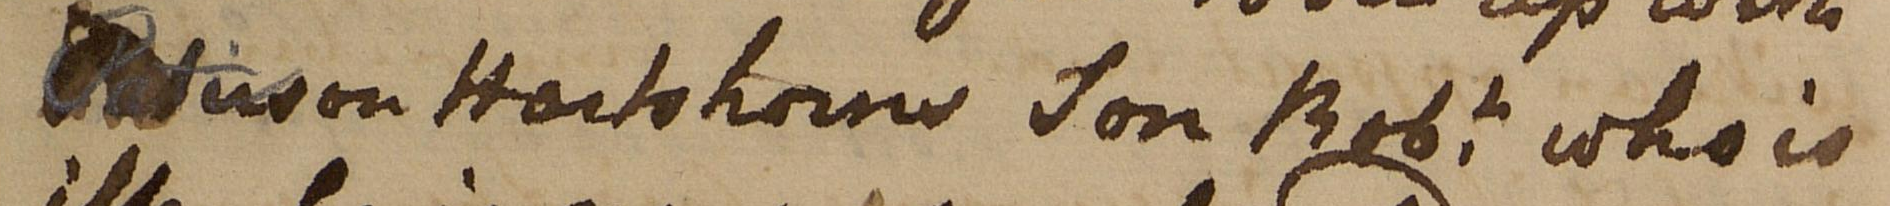[__]Susan Hartshorn Son Rob^t. who is
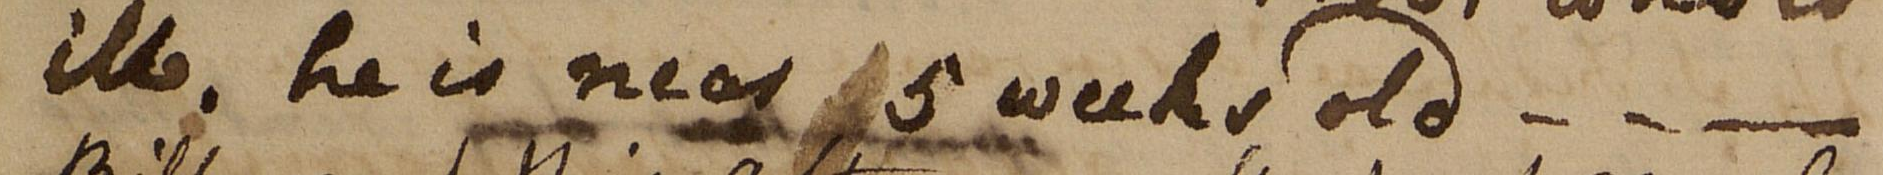ill, he is near 5 weeks old---
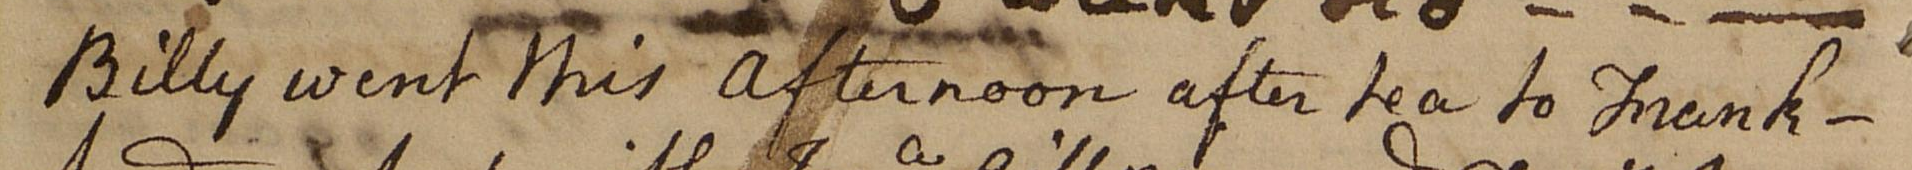Billy went this Afternoon after tea to Frank-
